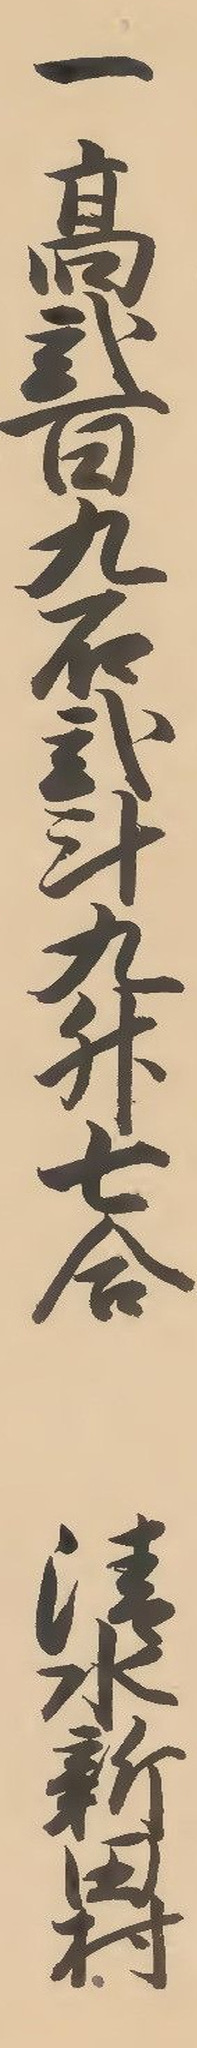一髙弐百九石弐斗九升七合清水新田村
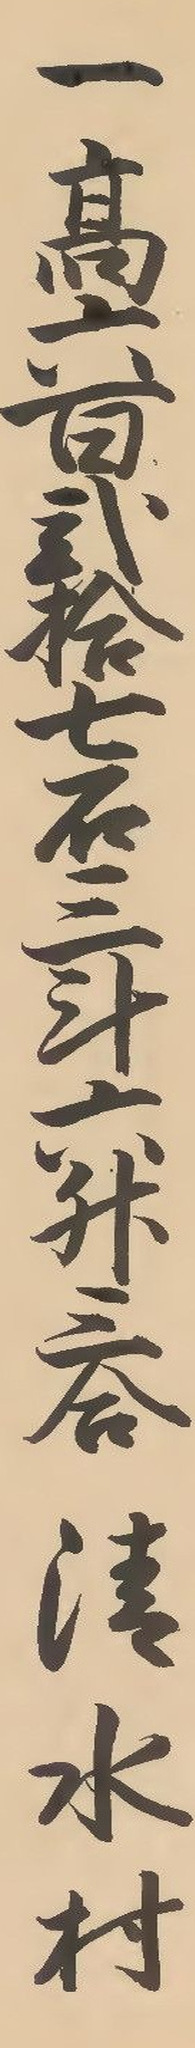一髙六百弐拾七石三斗六升三合清水村
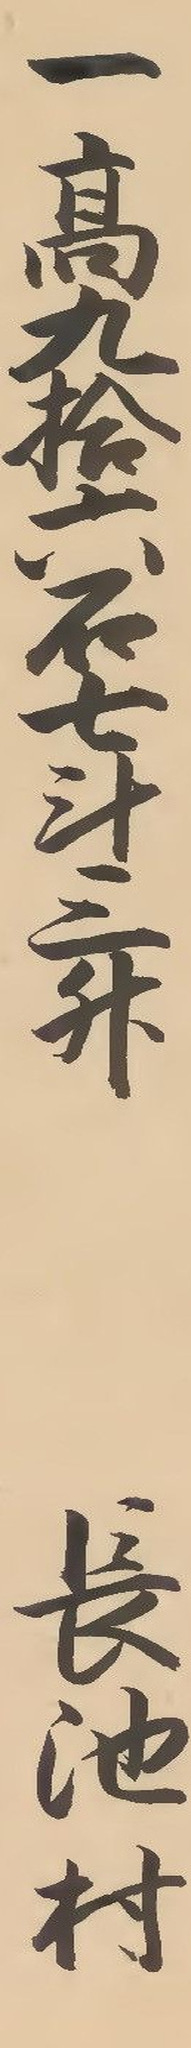一髙九拾六石七斗三升長池村
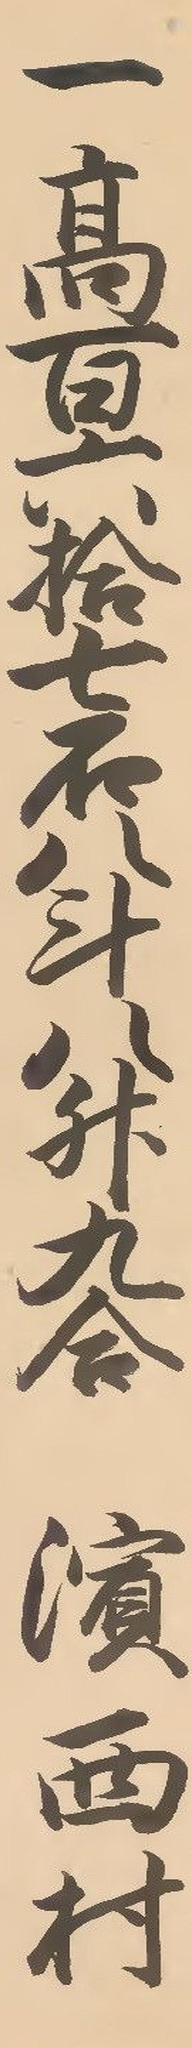一髙百六拾七石八斗八升九合濱西村
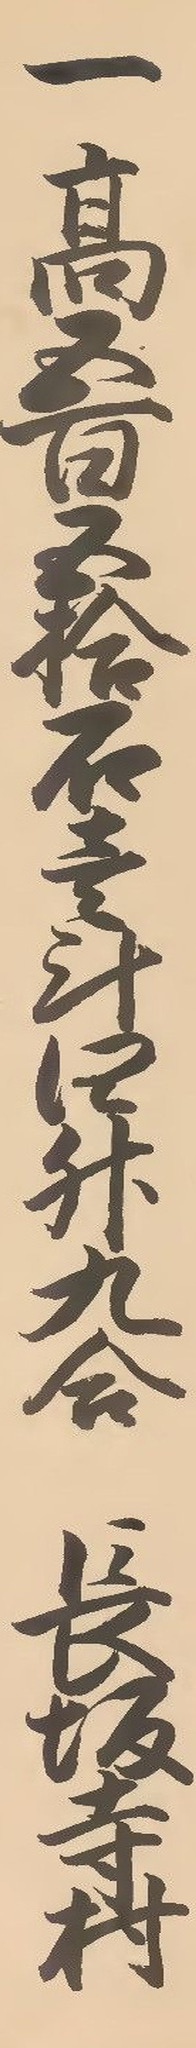一髙五百五拾石壱斗四升九合長坂寺村
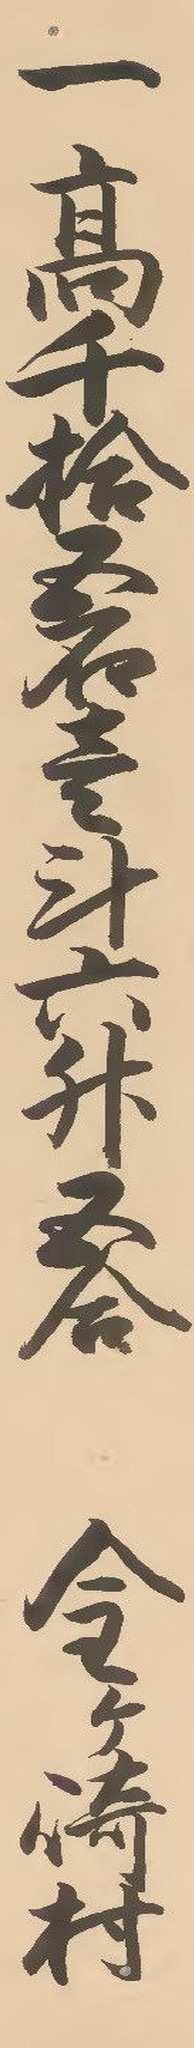一髙千拾五石壱斗六升五合金ケ崎村
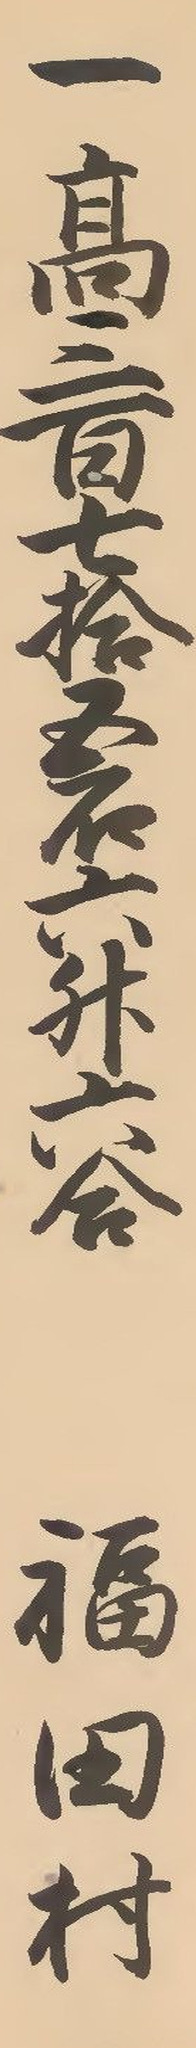一髙三百七拾五石六升六合福田村

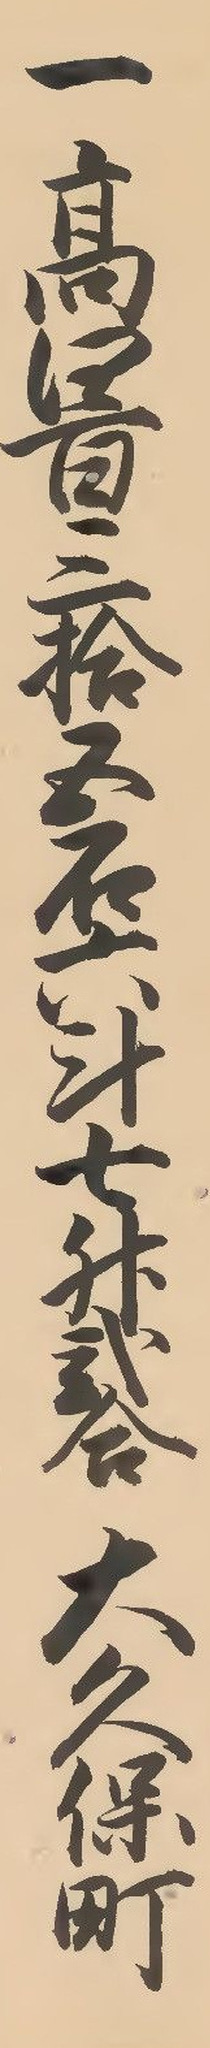一髙四百三拾五石六斗七升弐合大久保町
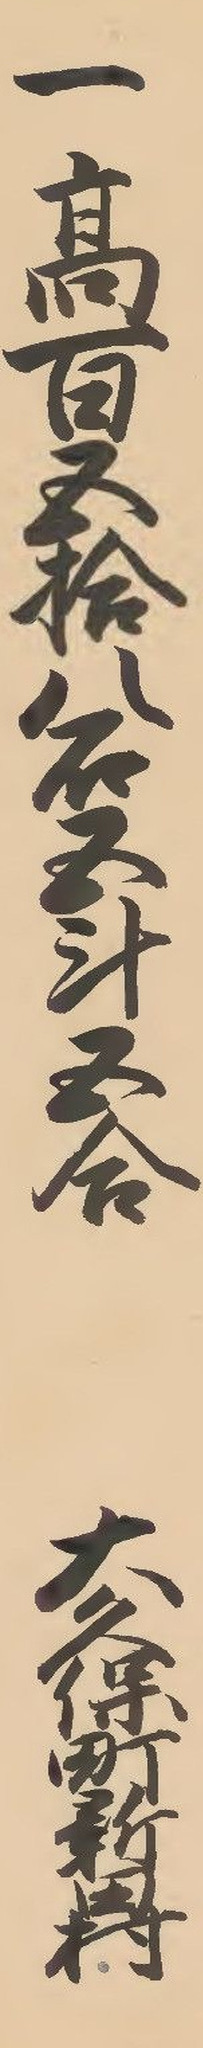一髙百五拾八石五斗五合大久保町新田村
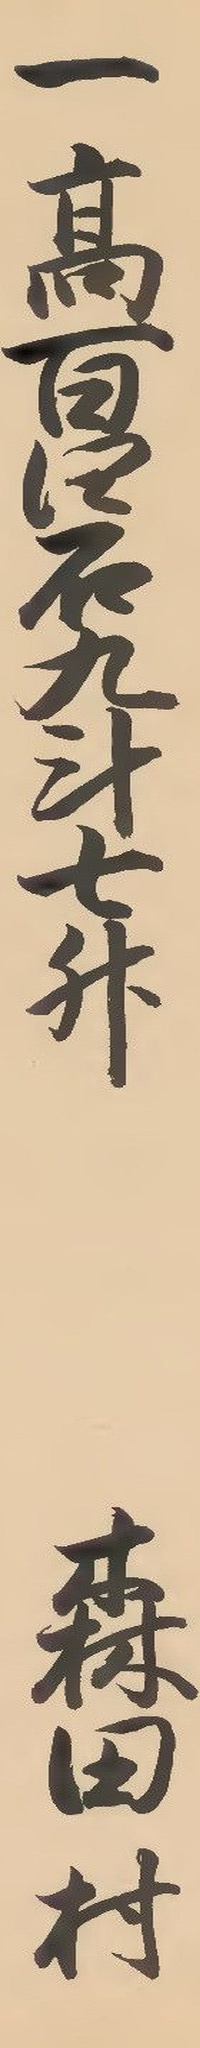一髙百四石九斗七升森田村
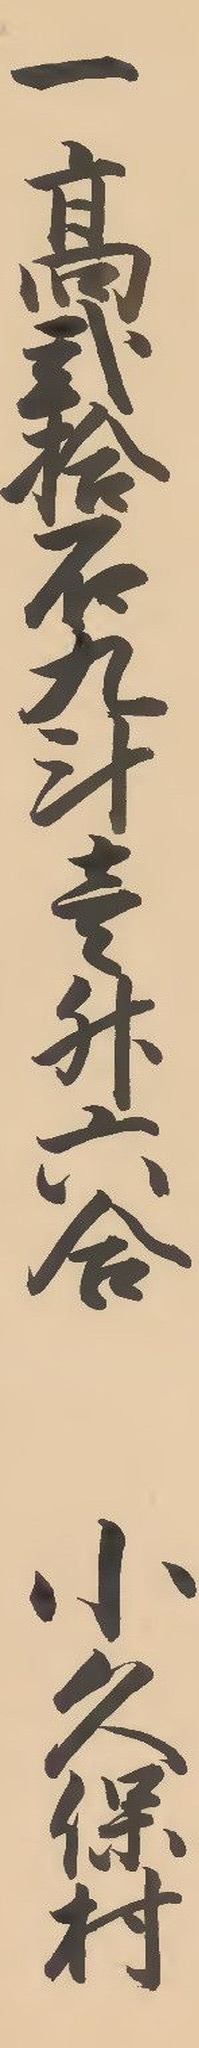一髙弐拾石九斗壱升六合小久保村
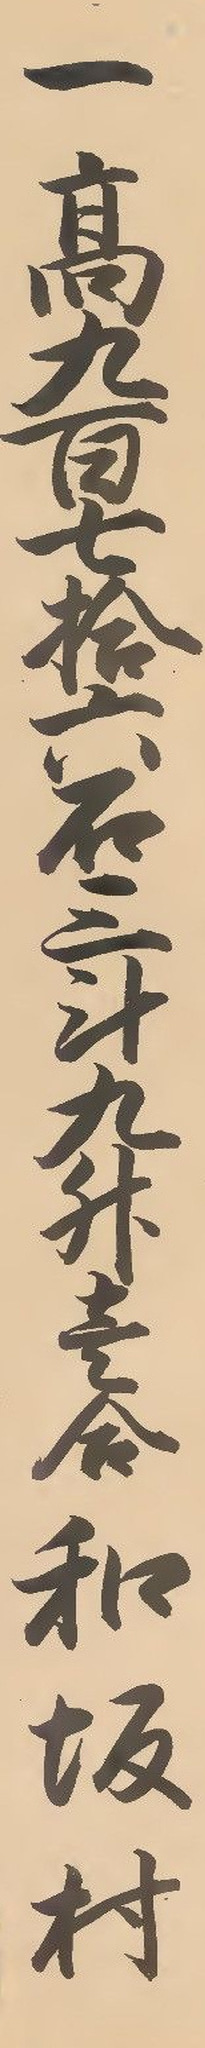一髙九百七拾六石三斗九升壱合和坂村
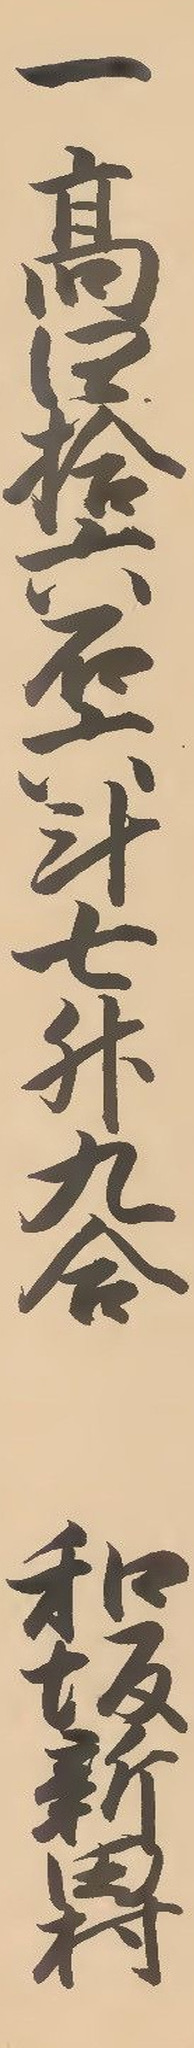一髙四拾六石六斗七升九合和坂新田村
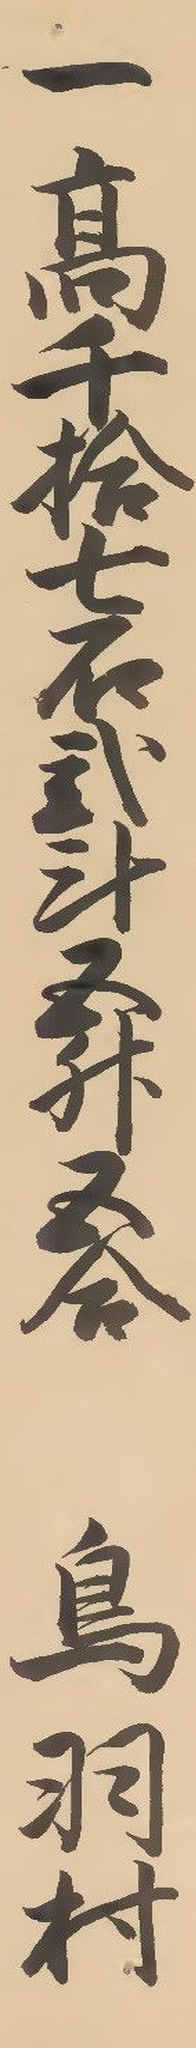一髙千拾七石弐斗五升五合鳥羽村
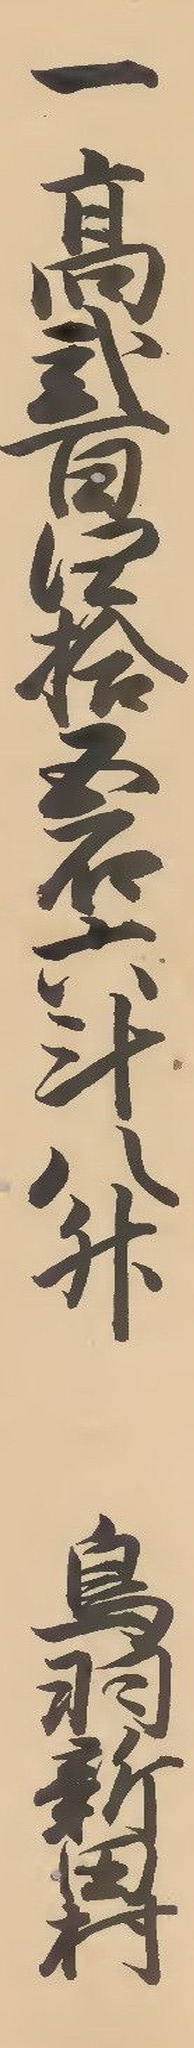一髙弐百四拾五石六斗八升鳥羽新田村

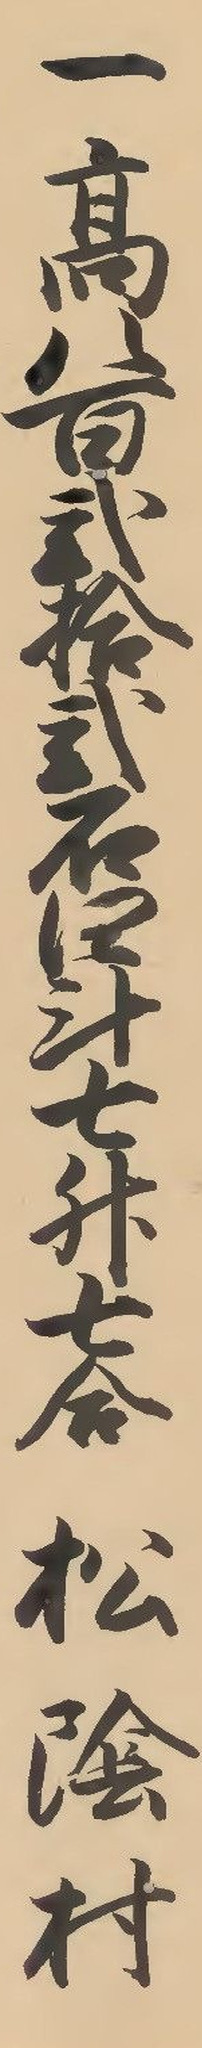一髙八百弐拾弐石四斗七升七合松陰村
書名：播磨国郷帳
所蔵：国立公文書館 National Archives of Japan
